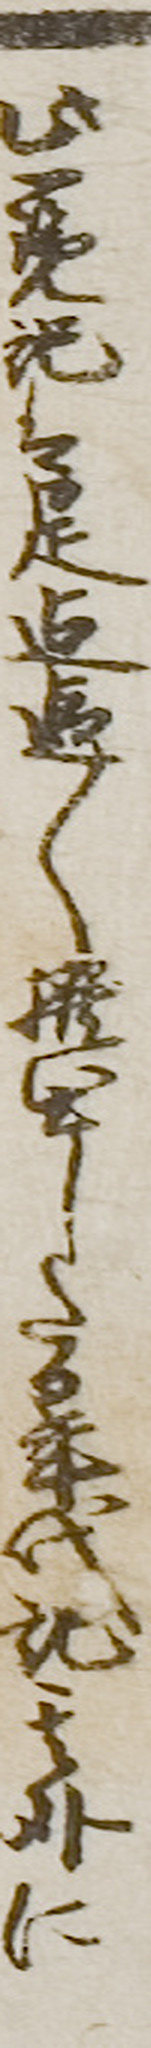此よめ記は是迄追〳〵撥出したる年代記其外に
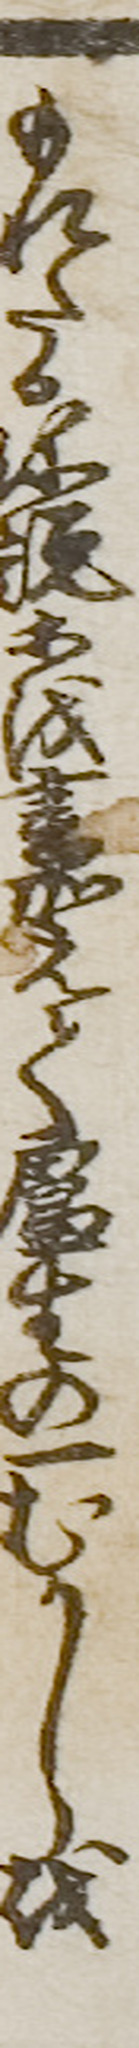もれたる珍説等を書加えて盧生の一むかしを
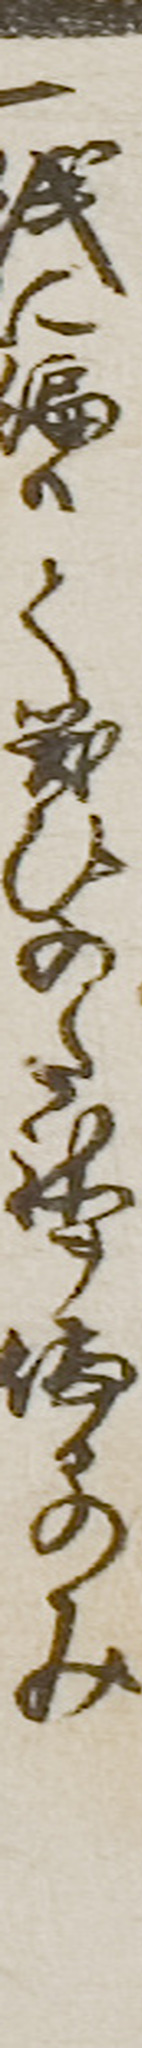一紙に編て笑ひのたねに備るのみ
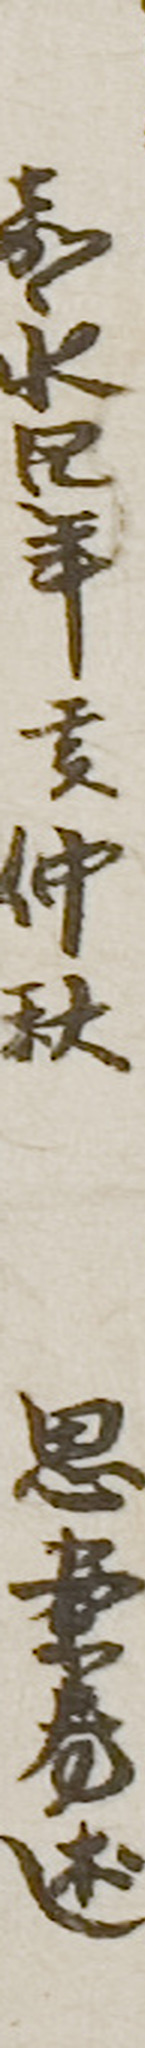嘉永四年亥仲秋思案房述
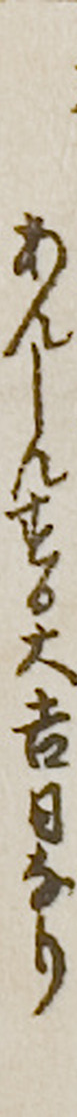あんしんする大吉日なり
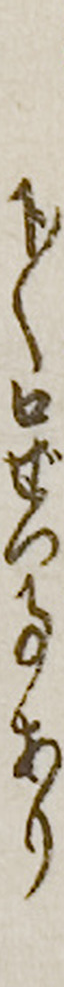下〳〵口ぜつ事あり
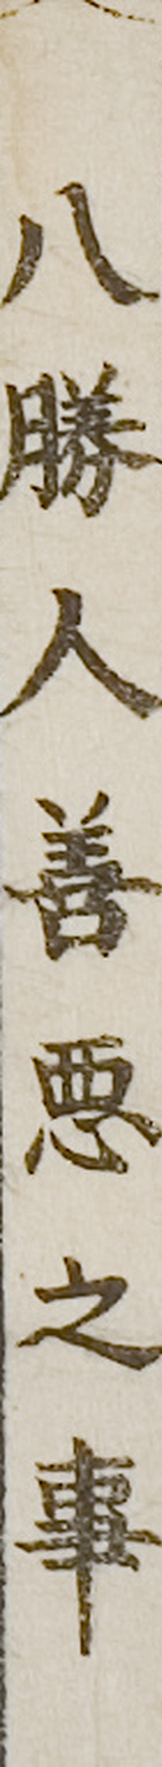八勝人善悪之事
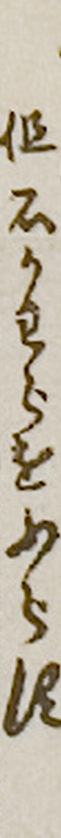但石かわらをふらす
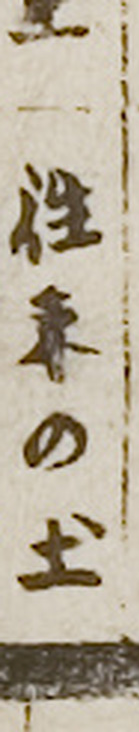三往来の土
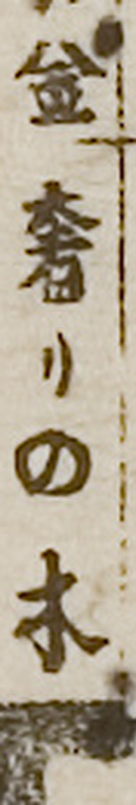三奢りの木
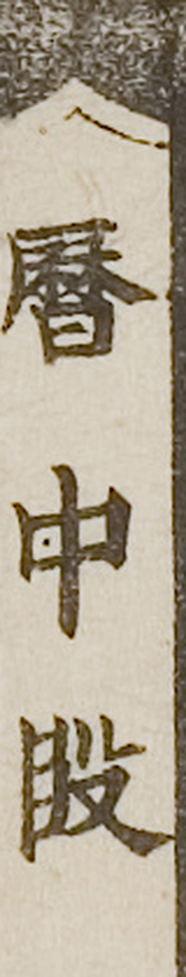暦中段
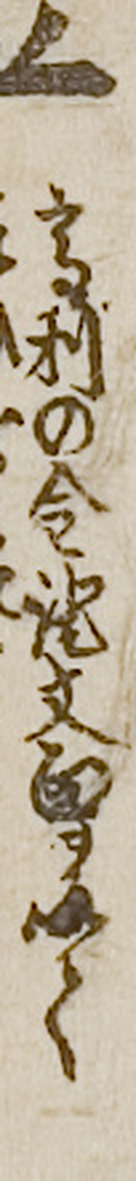高利の金證文面を以て
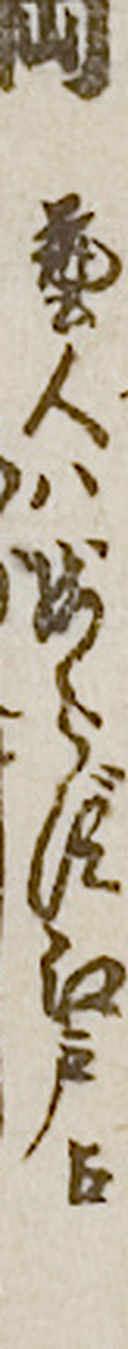芸人は残らず江戸へ
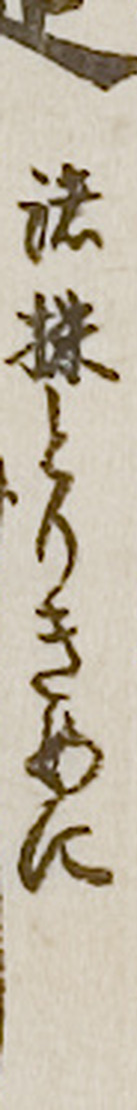諸株とりきめに
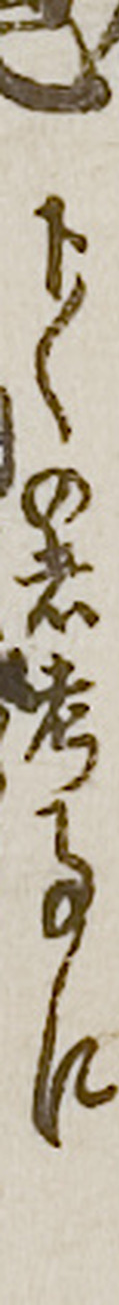下〳〵の者考事に
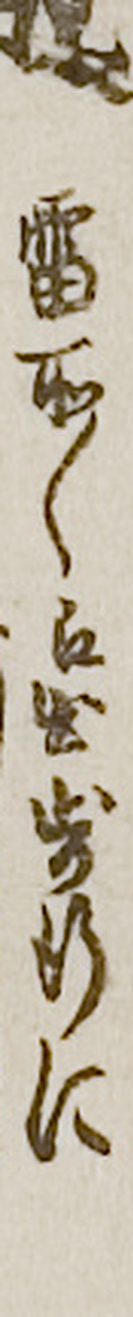雷所〳〵へ出歩行に
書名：天保改勢珍説増補鯰年代雑記
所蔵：東京大学総合図書館 General Library in the University of Tokyo, JAPAN
